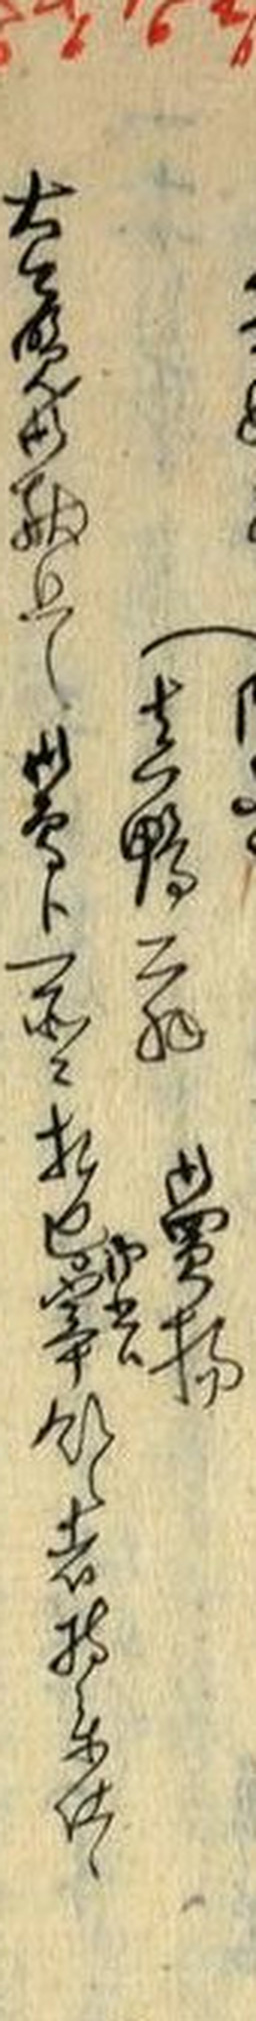右今晩御献上之御鳥ト一所ニ相廻御書ハ宰領之者持参仕候
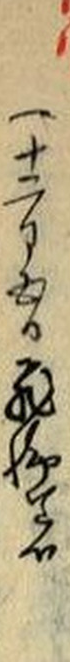一十二月五日飛脚着
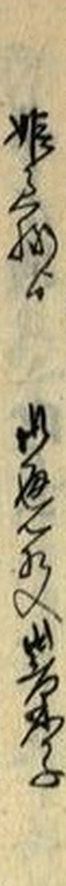姫君様ゟ御通箱入御菓子
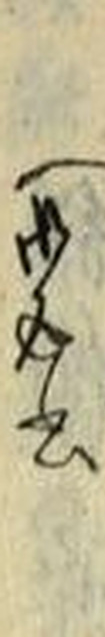御返書
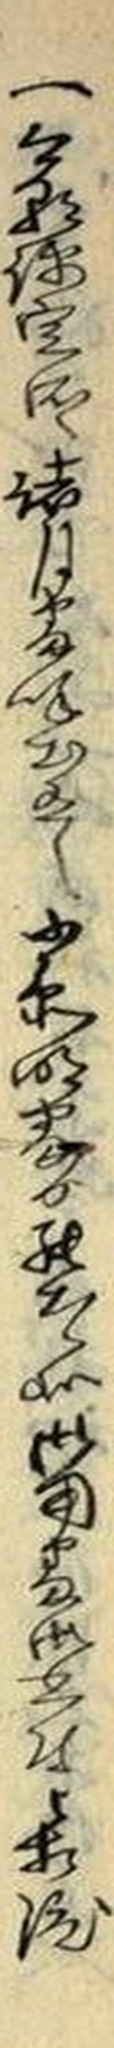一今朝評定所へ詰月番呼出有之小兵衛明番ゟ罷出候処御用番御書付被相渡
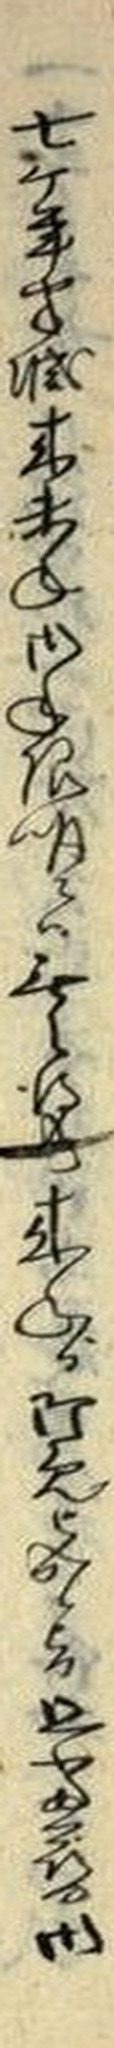七ヶ年半賦来未年御年限明ニハ無之候得共来年ゟ御免被成候旨且当暮御
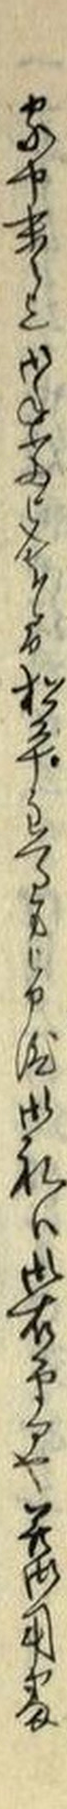家中未々迄御手当被成下旨松平主馬方被申渡御礼ハ御右筆部や并御用番
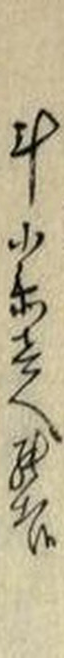斗小兵衛壱人罷出候
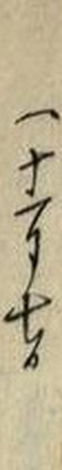一十二月七日
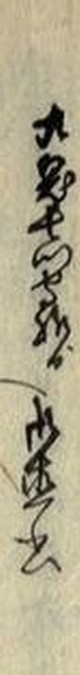九鬼長門守様ゟ御直書
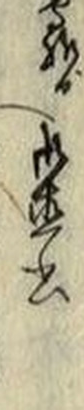御返書
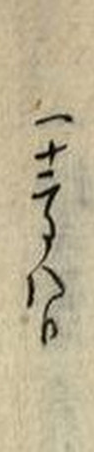一十二月八日
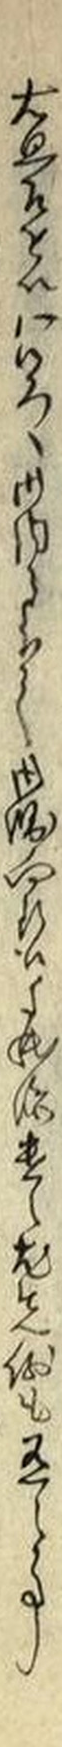右思召を以八左衛門へ御内々被下之御側向頭取手紙添遣之尤先例も有之事
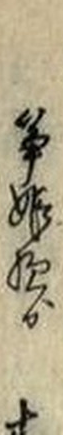箏姫様ゟ

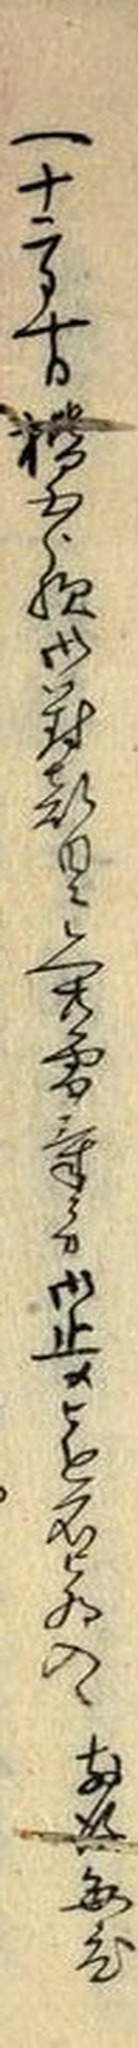一十二月十日揩五郎様御対顔日ニ候へ共雪気ニ付御止メ被進不被為入候前後毎度
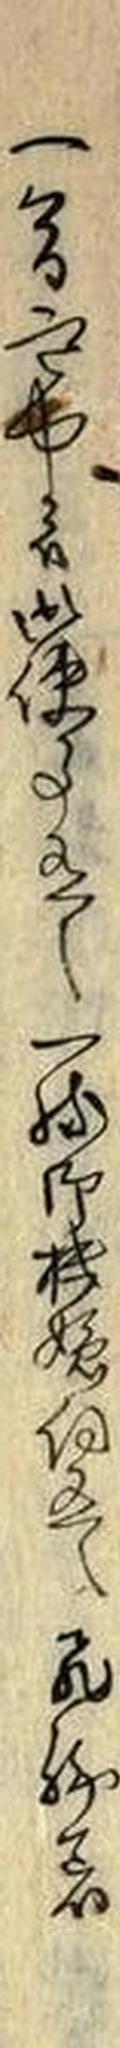一今日寒中ニ付御使事有之一統御機嫌伺有之飛脚着
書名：少傅日録抄（斉承付側向頭取日記、在国）
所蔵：福井県文書館 Fukui Prefectural Archives
